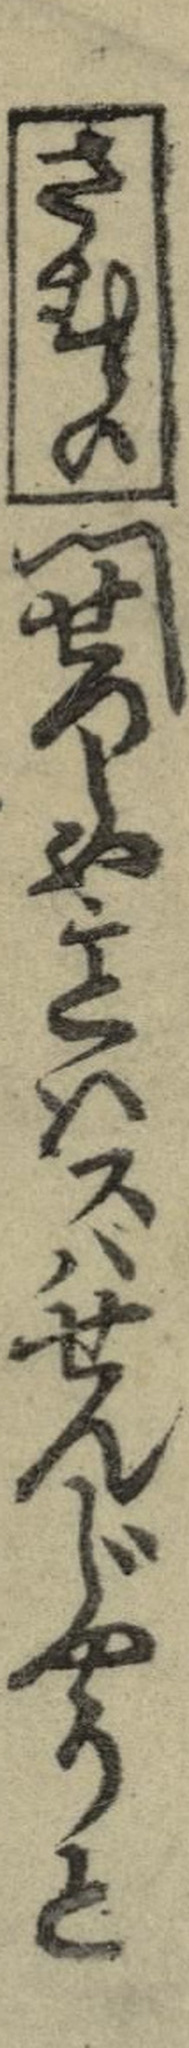さむらい〽せつしやことはスハせんじやうと
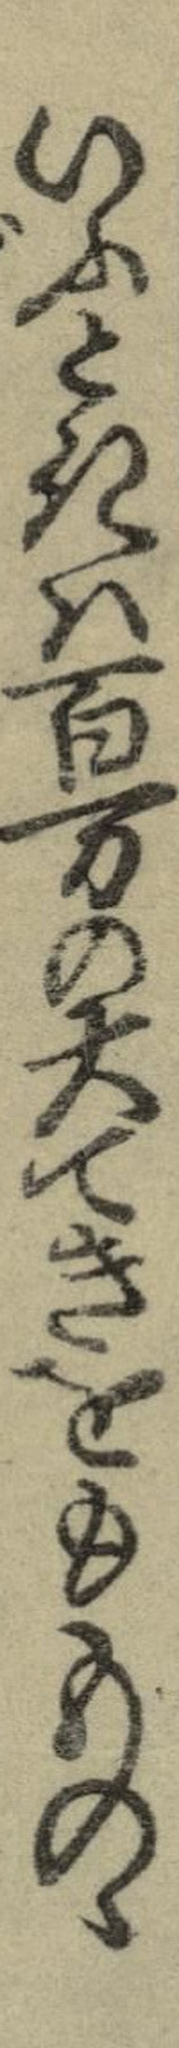いふときは百万の大てきをもものゝ
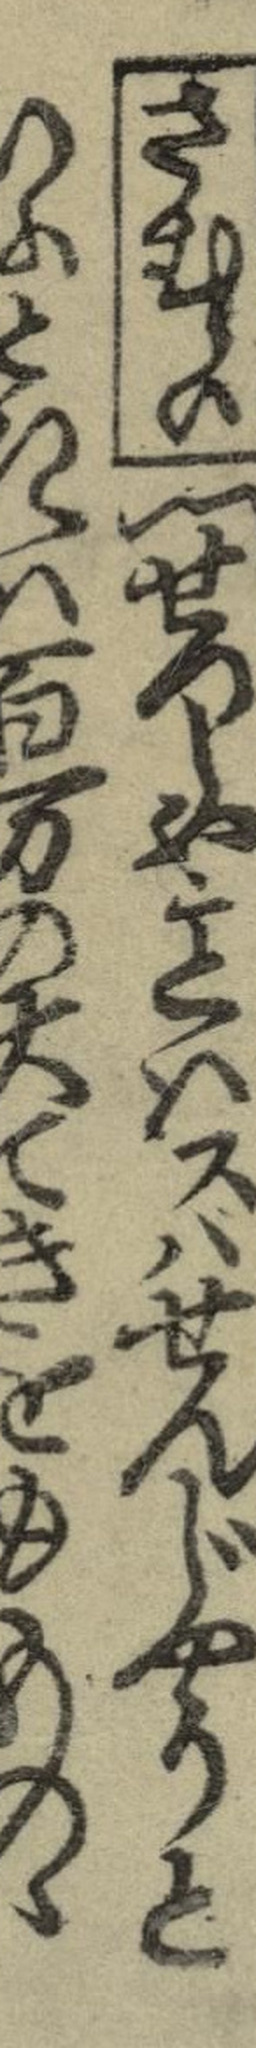いふときは百万の大てきをもものゝ
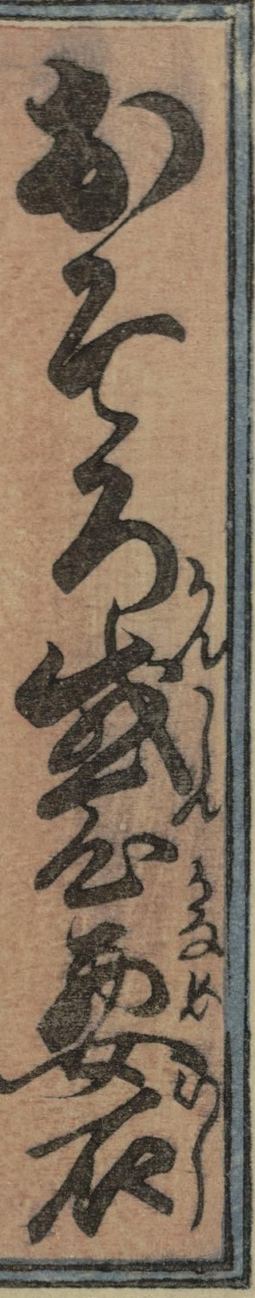おそろ感心要石
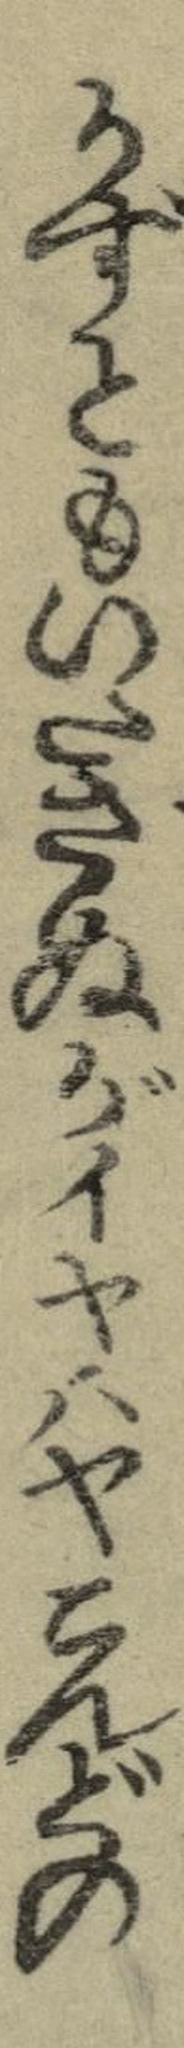かずともいたさぬがイヤハヤこんどの
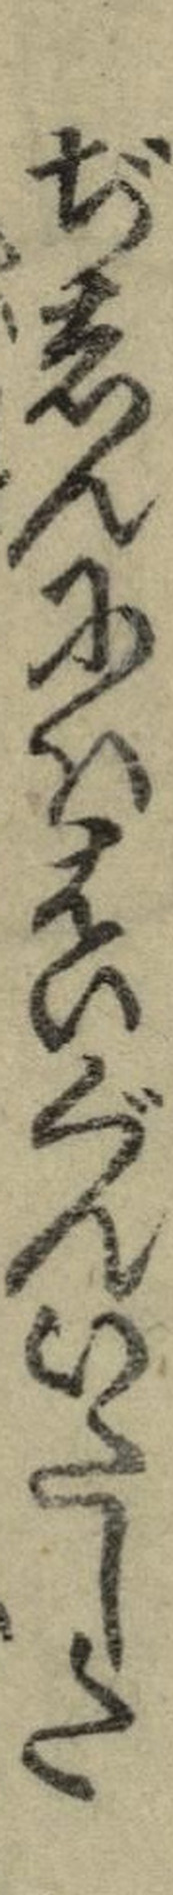ぢしんにははいぐんいたした
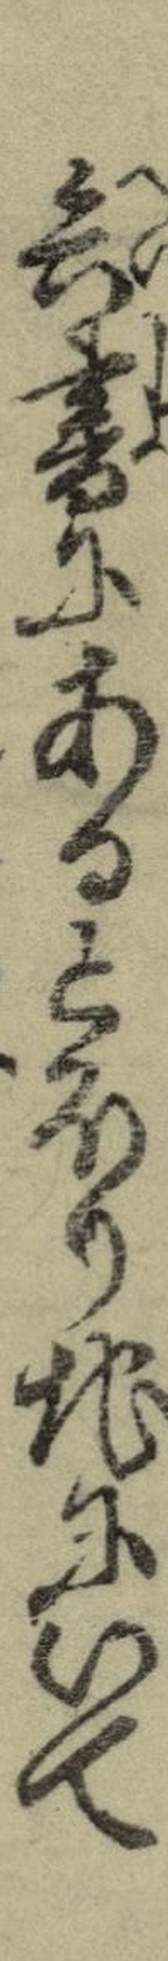兵書にあるとほり地にいて
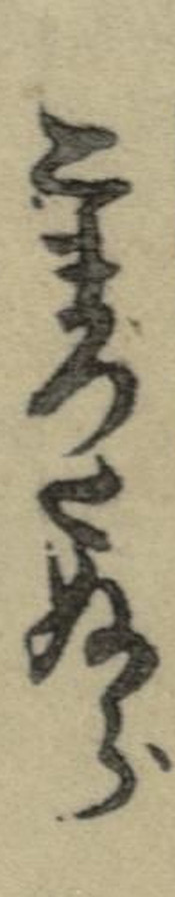こまつたぬら
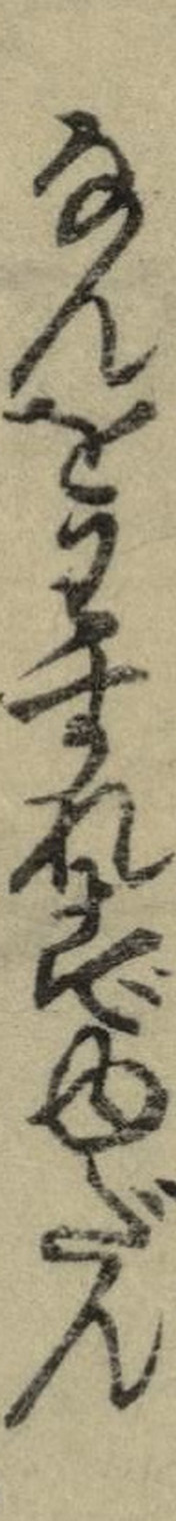なんをわすれずゆだん
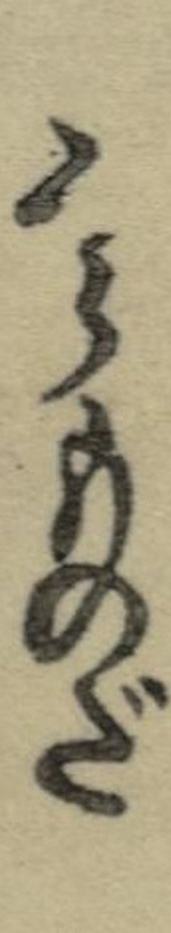くらものだ
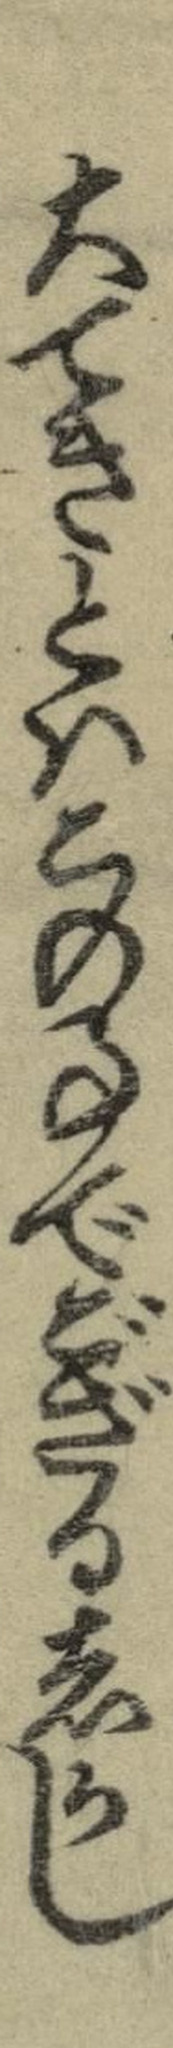大てきとはこの事でござるしかし
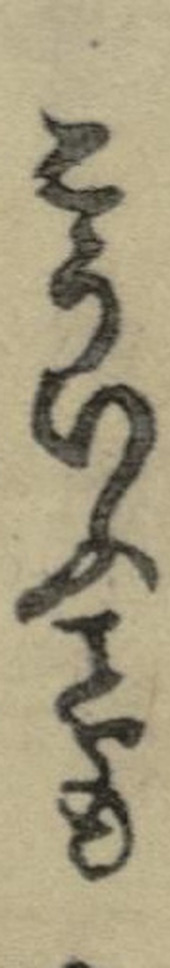こういふことも
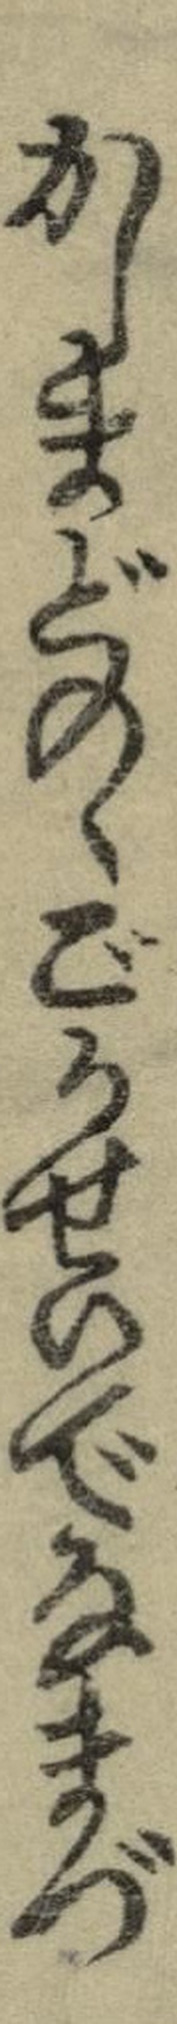かしまどのゝごかせいでなまづ
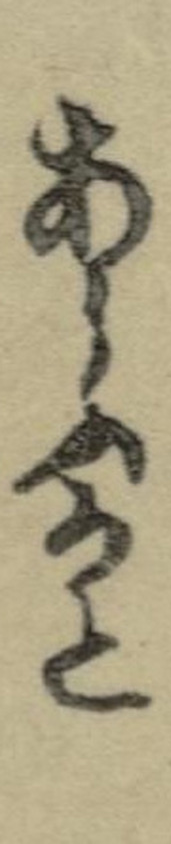あらふかと
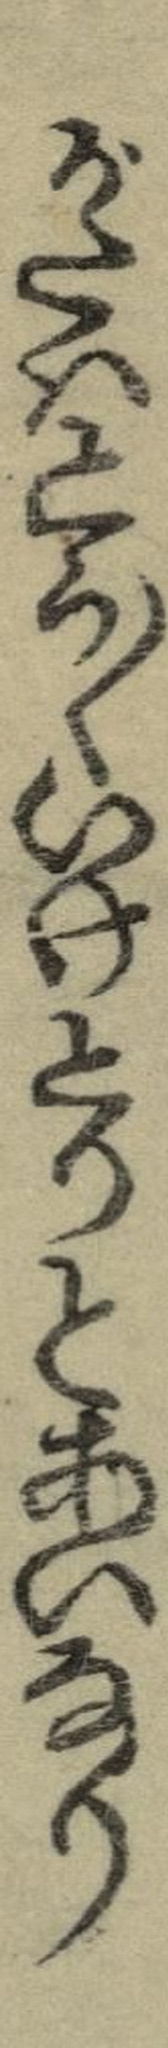がたはとう〳〵いけとりとあいなり
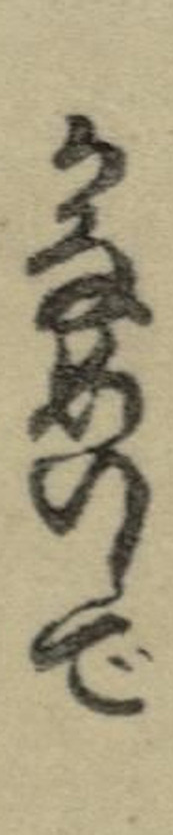かなめいしで
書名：おそろ感心要石
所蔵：東京大学地震研究所図書室 Earthquake Research Institute Library, The University of Tokyo, JAPAN
